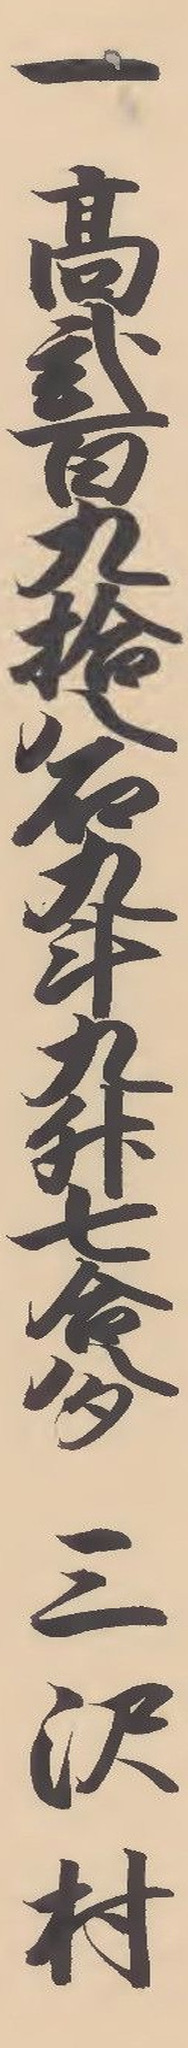一高弐百九拾八石九斗九升七合八勺三沢村
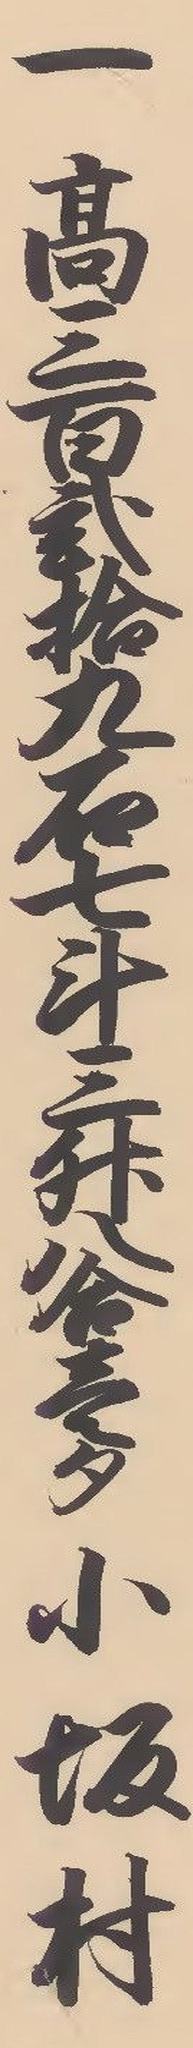一高三百弐拾九石七斗三升八合壱勺小坂村

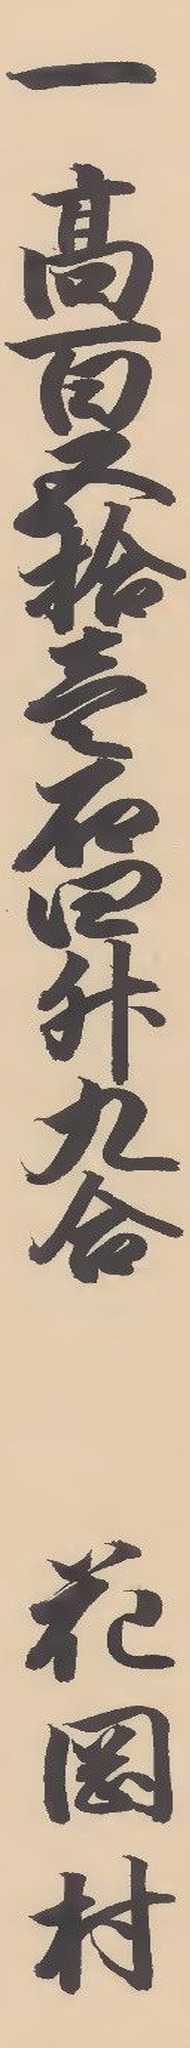一高百五拾壱石四升九合花園村
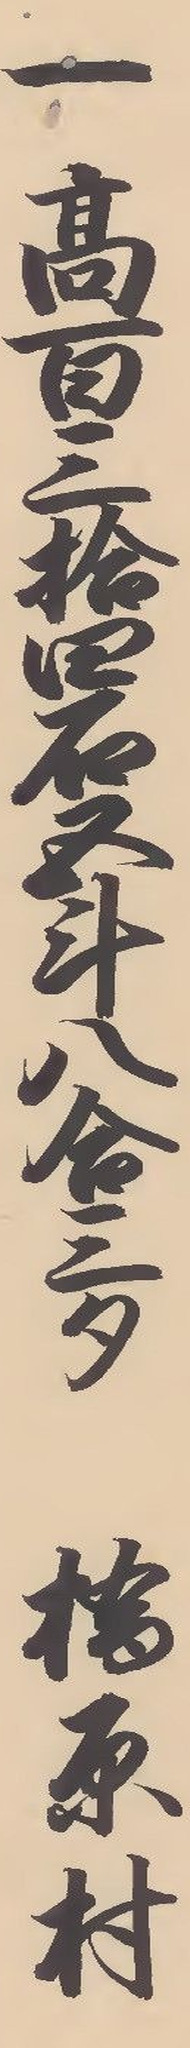一高百三拾四石五斗八合三勺橋原村
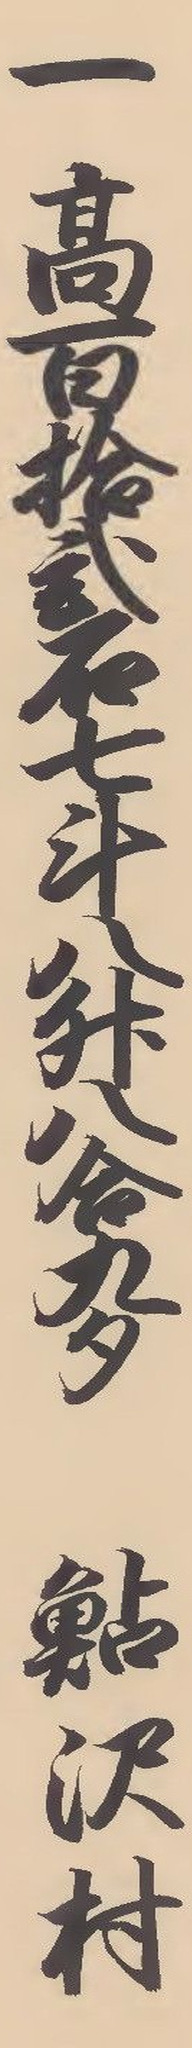一高百拾弐石七斗八升八合九勺鮎沢村
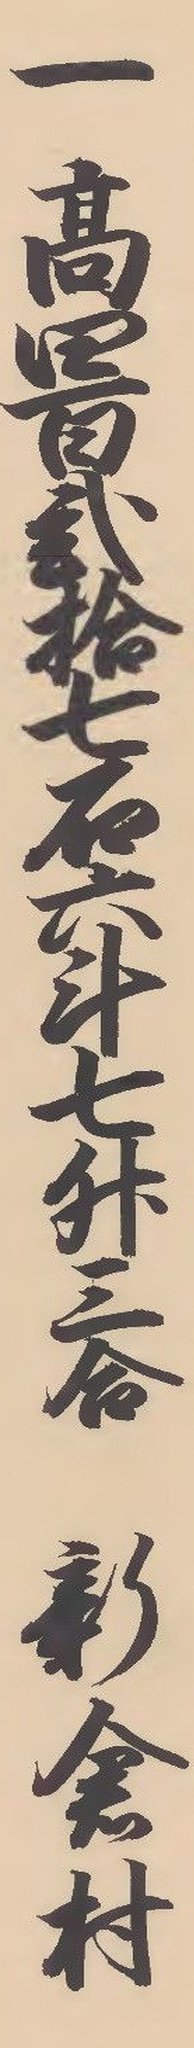一高四百弐拾七石六斗七升三合新倉村
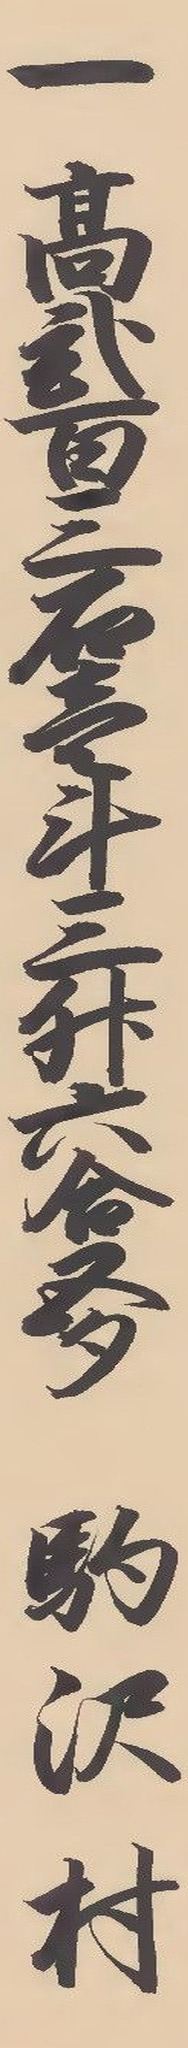一高弐百三石壱斗三升六合五勺駒沢村
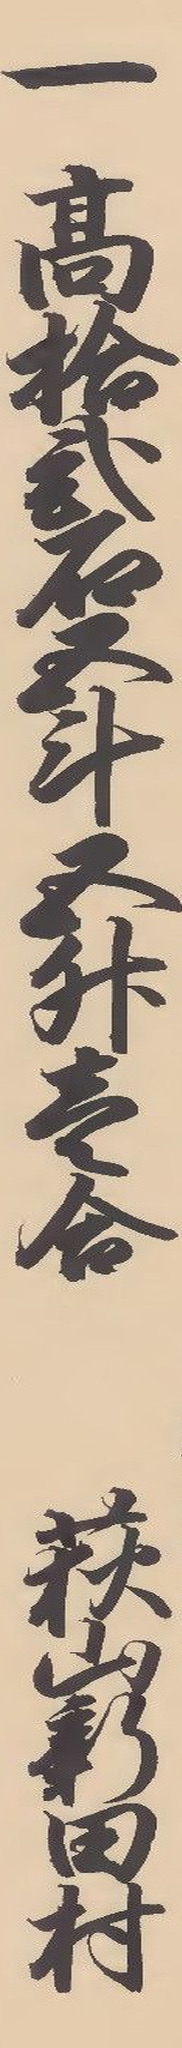一高拾弐石五斗五升壱合荻山新田村
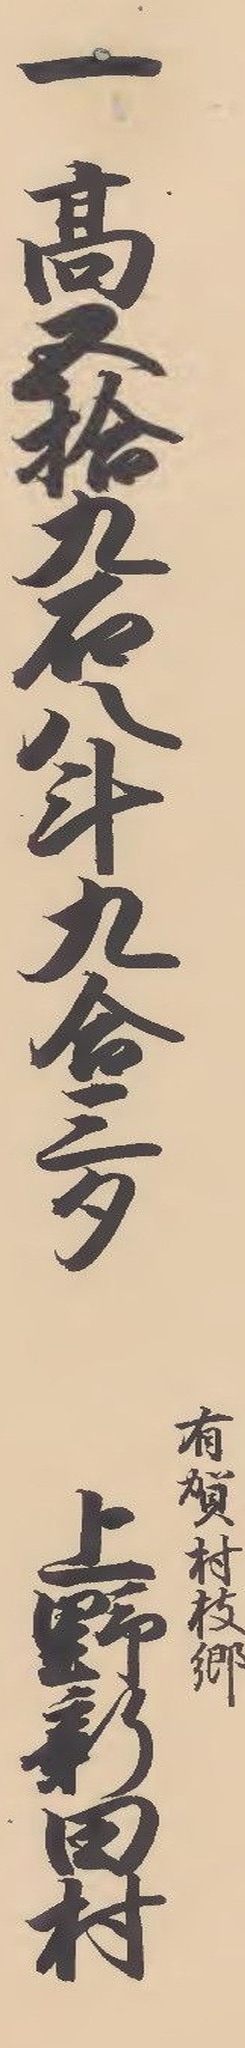一高五拾九石八斗九合三勺上野新田村
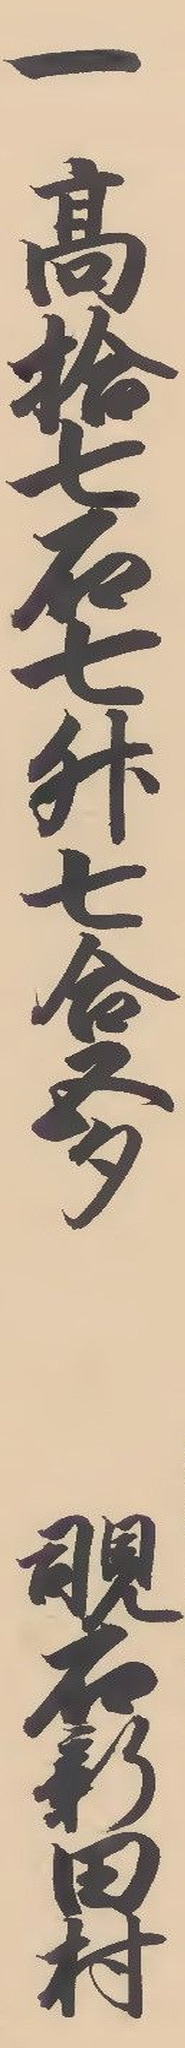一高拾七石七升七合五勺覗石新田村

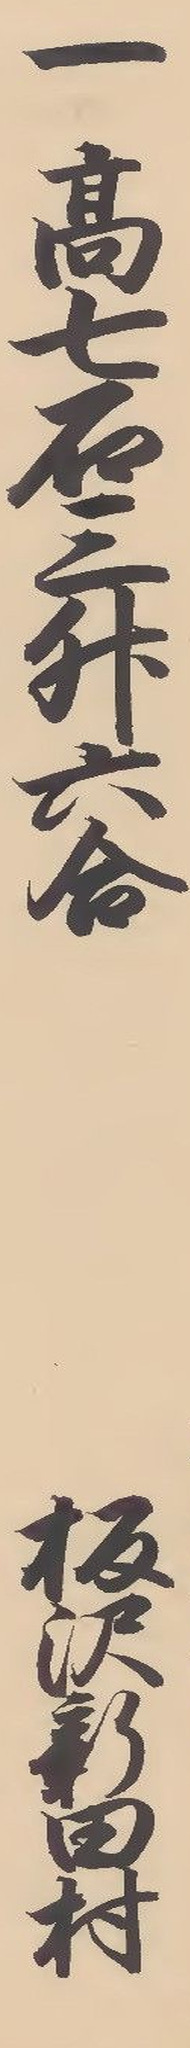一高七石三升六合板沢新田村
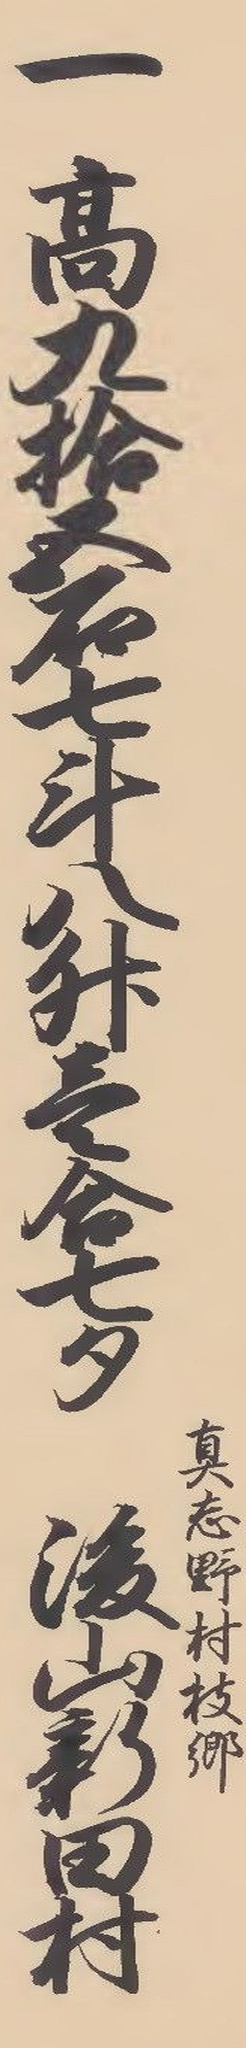一高九拾五石七斗八升壱合七勺後山新田村
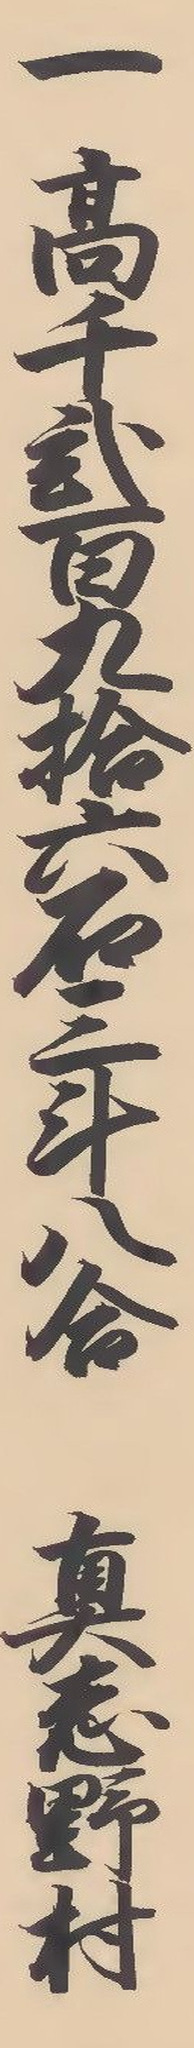一高千弐百九拾六石三斗八合真志野村
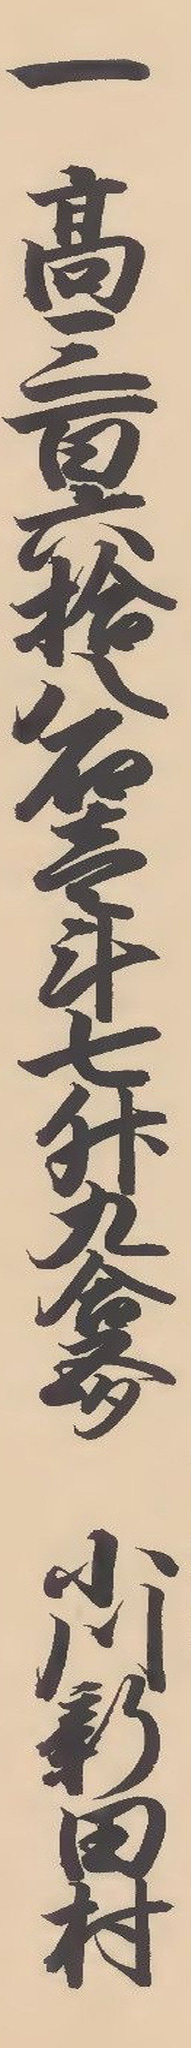一高三百六拾八石壱斗七升九合五勺小川新田村
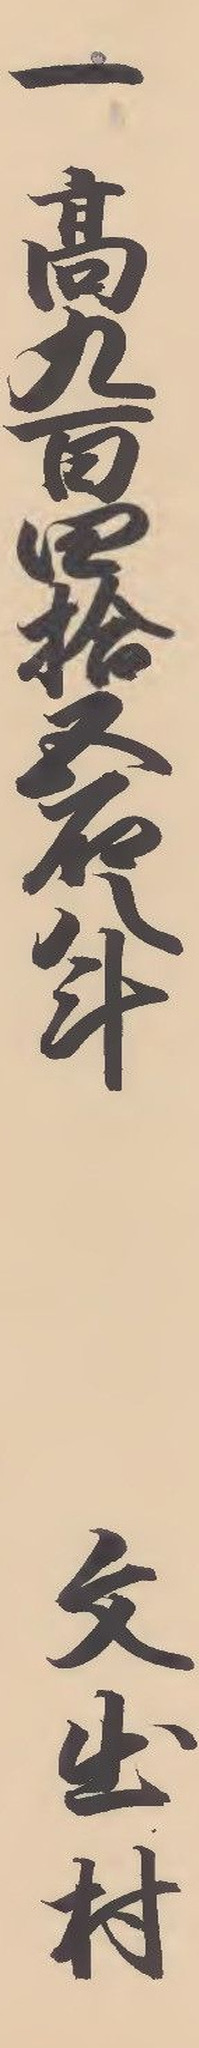一高九百四拾五石八斗文出村
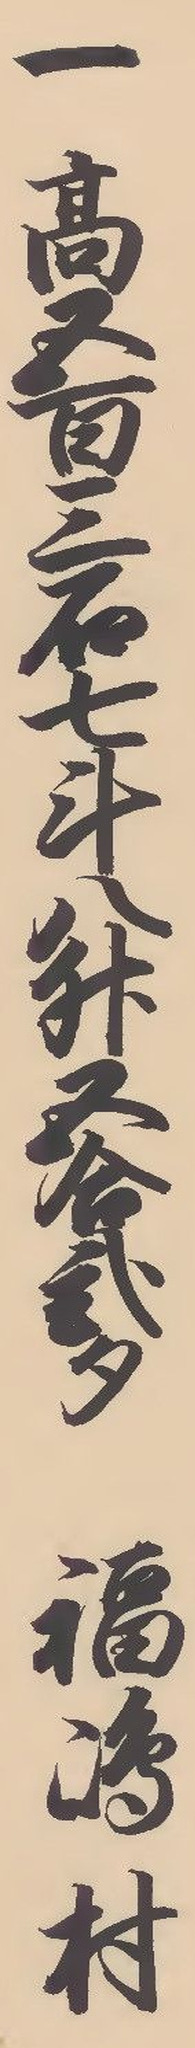一高五百三石七斗八升五合弐勺福島村
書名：信濃国郷帳
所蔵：国立公文書館 National Archives of Japan
